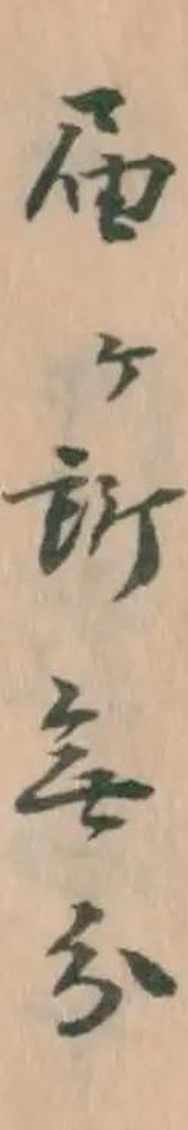届ヶ所無分
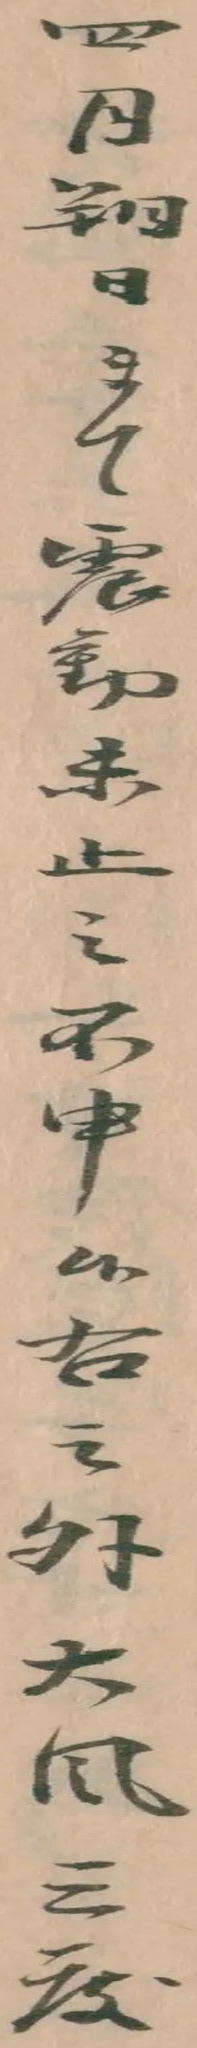四月朔日まて震動未止之不申候右之外大風三度
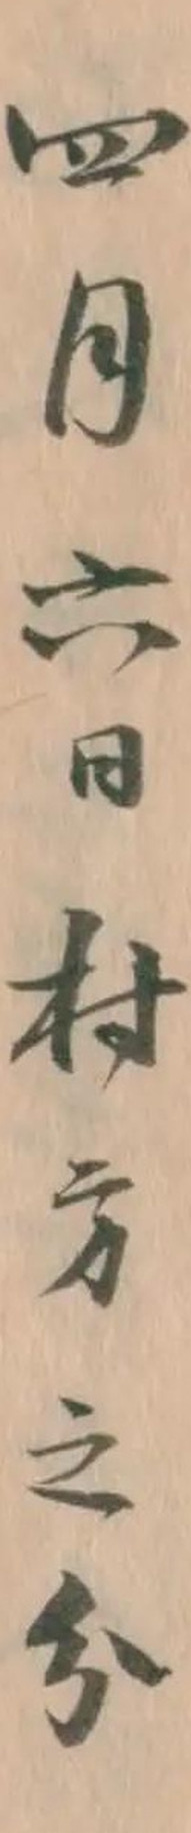四月六日村方之分

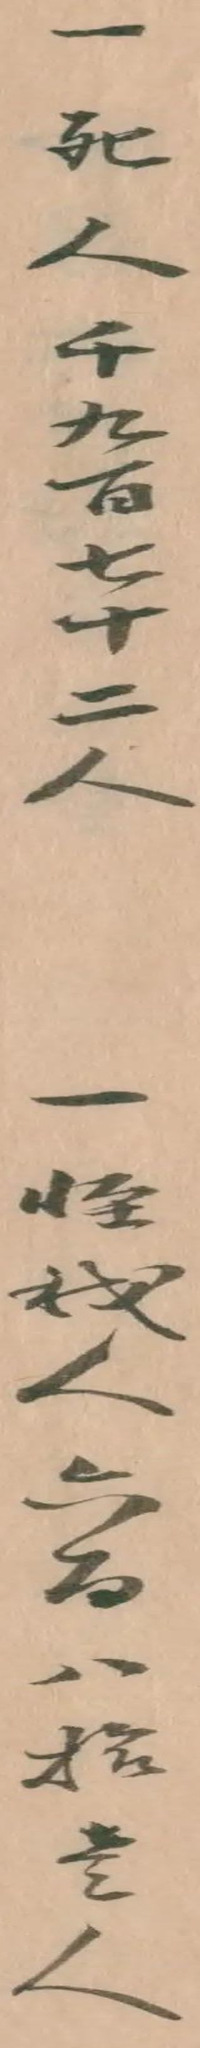一死人千九百七十二人一怪我人六百八十壱人
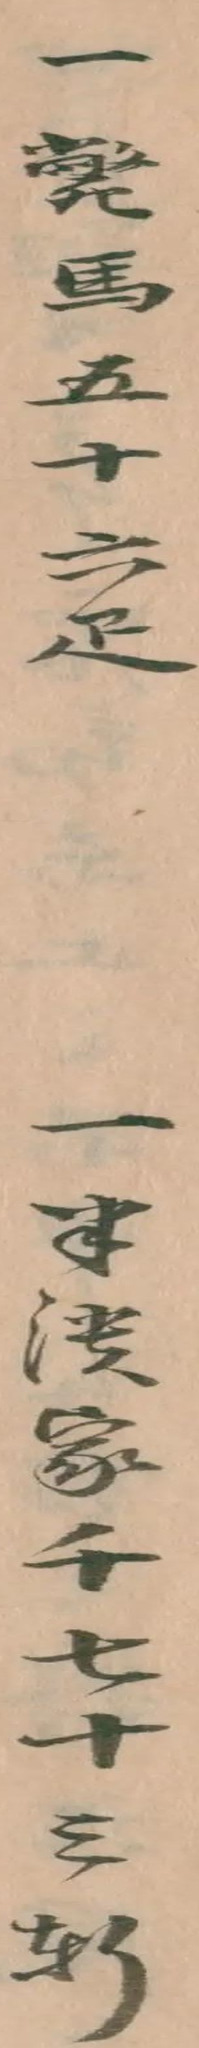一斃馬五十六疋一半潰家千七十三軒
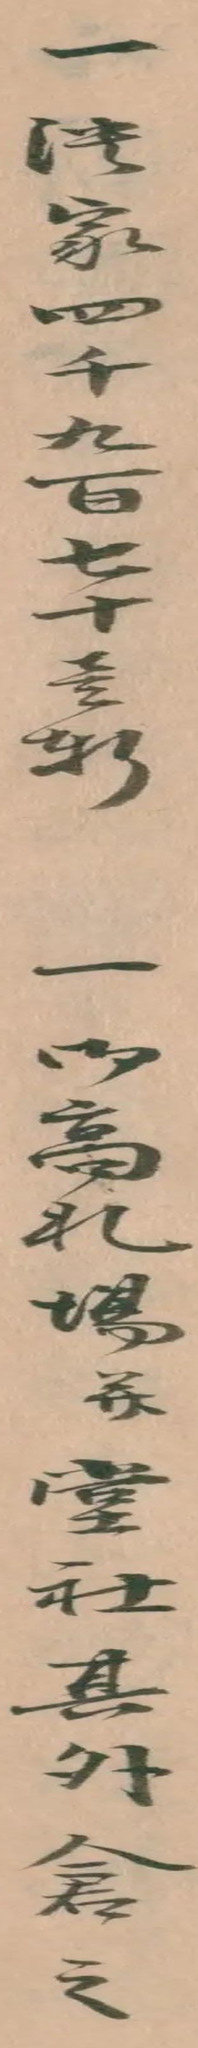一潰家四千九百七十壱軒一御高札場并堂社其外倉之
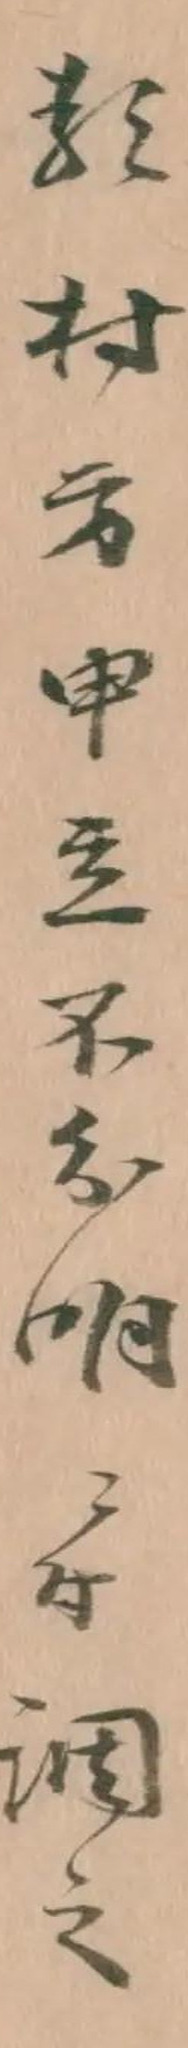類村方申立不分明二付調之候
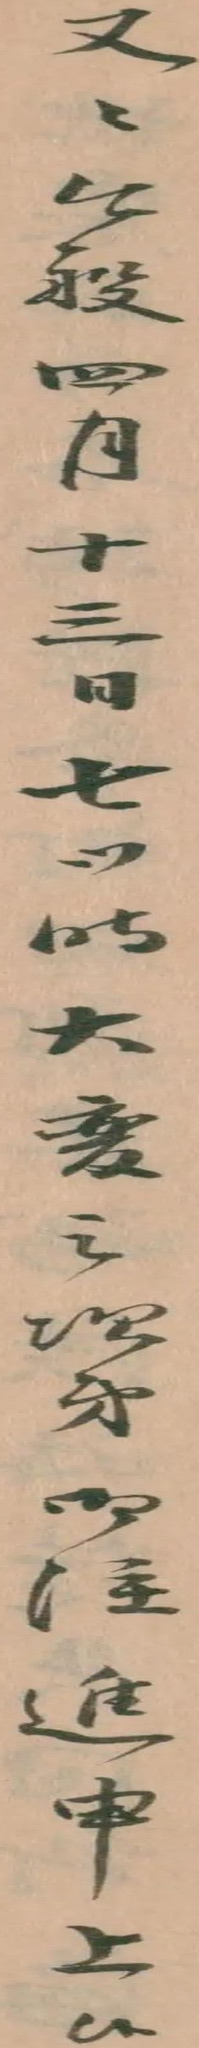又々今般四月十三日七ッ時大変之次第御注進申上候
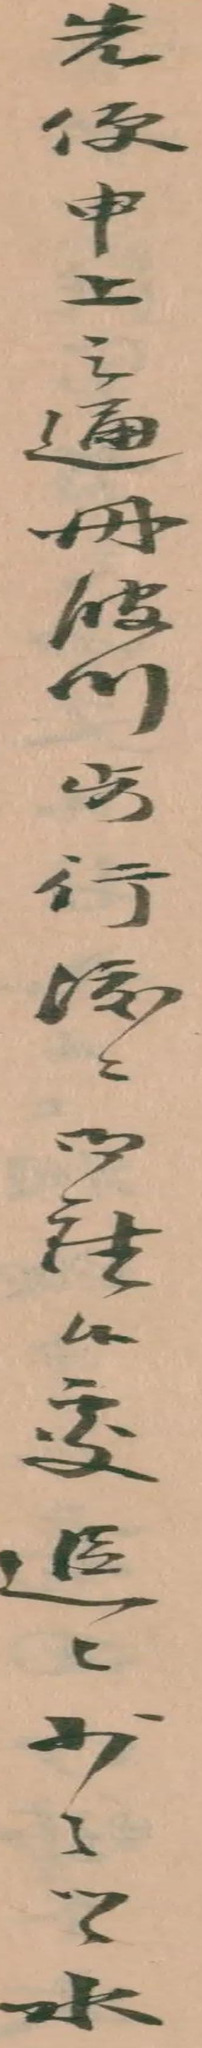先便申上之候通丹波川歩行渡二御座候処追々少々ッゝ水
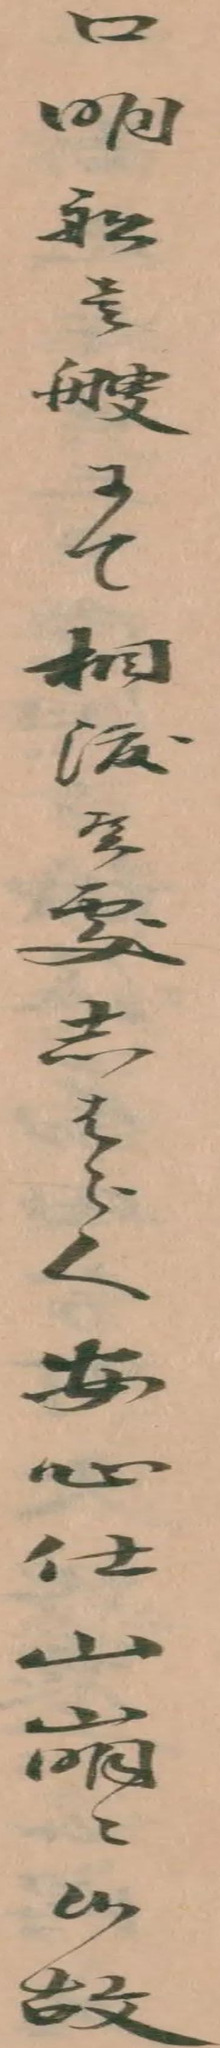口明船壱艘にて相渡候処しハらく安心仕山崩二候故
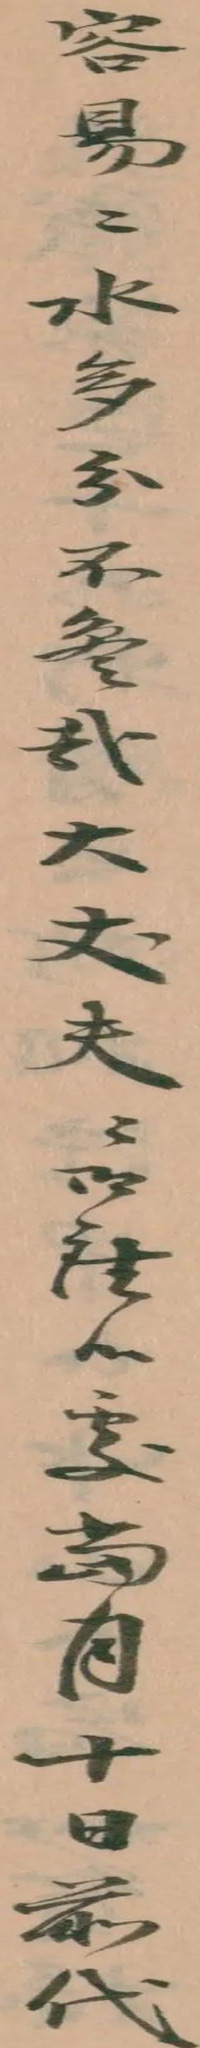容易二水多分不参哉大丈夫二御座候処当月十日前代
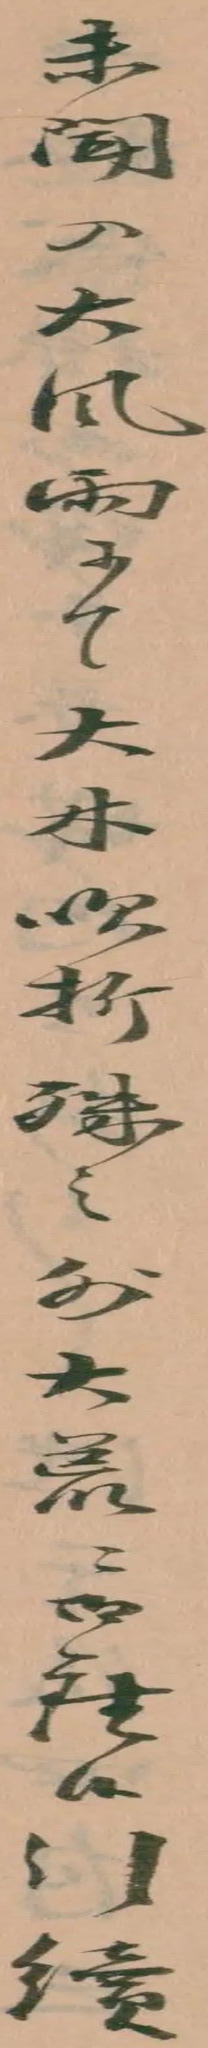未聞の大風雨にて大木吹折殊之外大荒二御座候引続
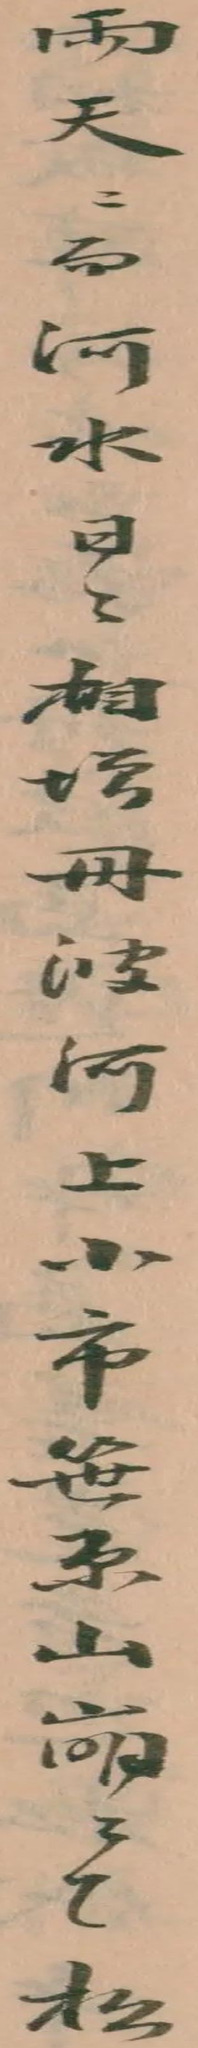雨天二而河水日々相増丹波河上小市笹原山崩にて松
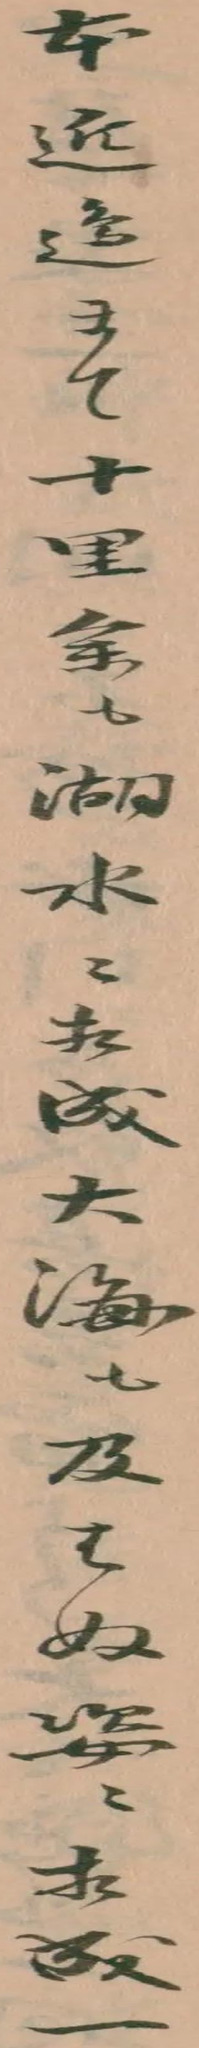本辺まて十里餘も湖水二相成大海も及はぬ姿二相成一
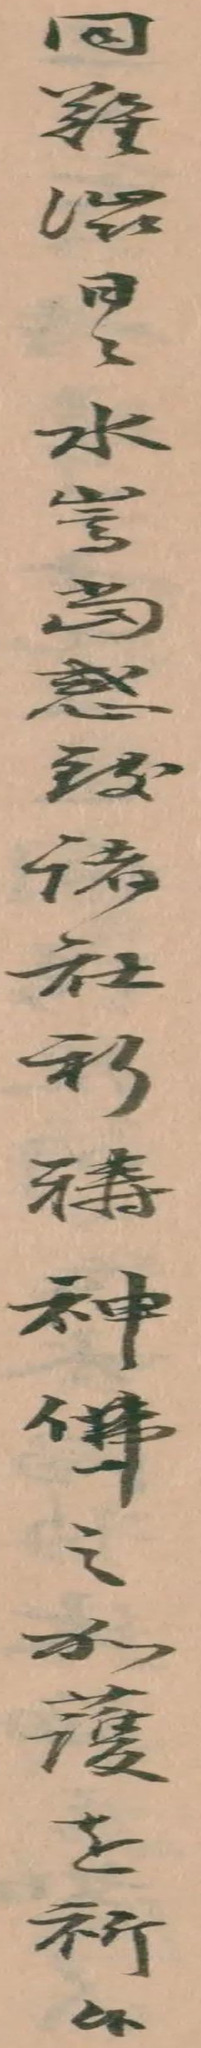同難渋日々水嵩当惑致諸社祈祷神仏之加護を祈候
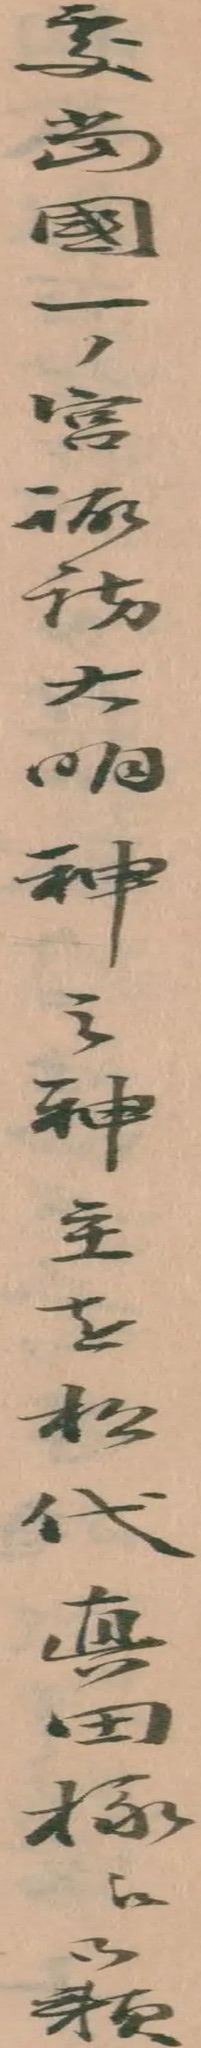処当国一ノ宮諏訪大明神之神主を松代真田様江御頼
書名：地災撮要. 巻3(地震之部)-巻4(噴火之部)
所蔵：国立国会図書館 National Diet Library, JAPAN
